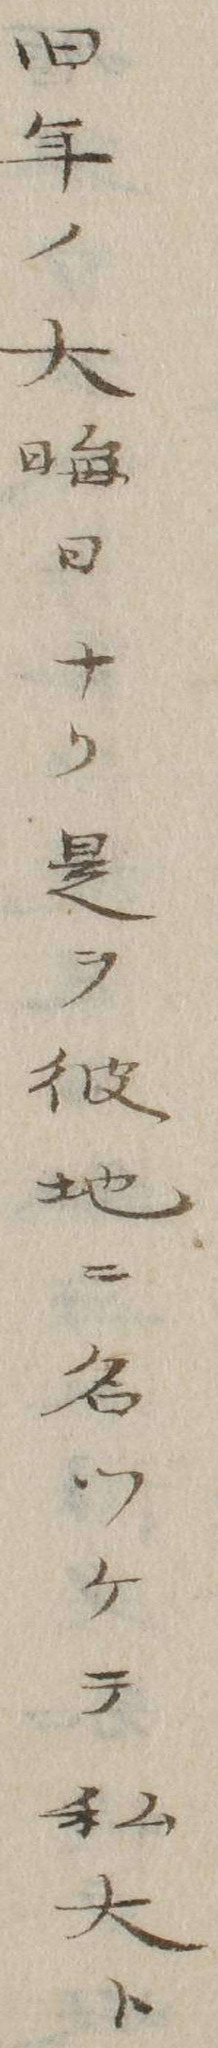旧年ノ大晦日ナリ是ヲ彼地ニ名ツケテ私大ト
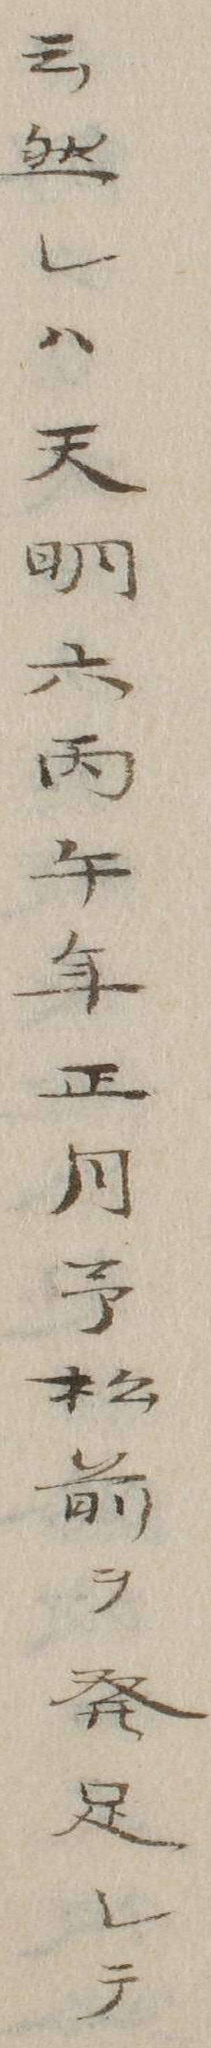云然レハ天明六丙午年正月予松前ヲ発足シテ
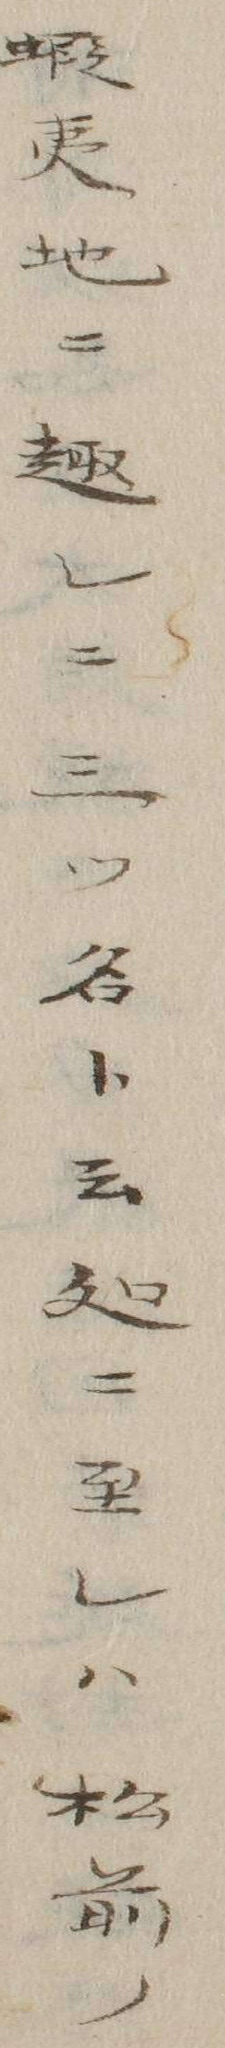蝦夷地ニ趣シニ三ッ名ト云処ニ至レハ松前ノ
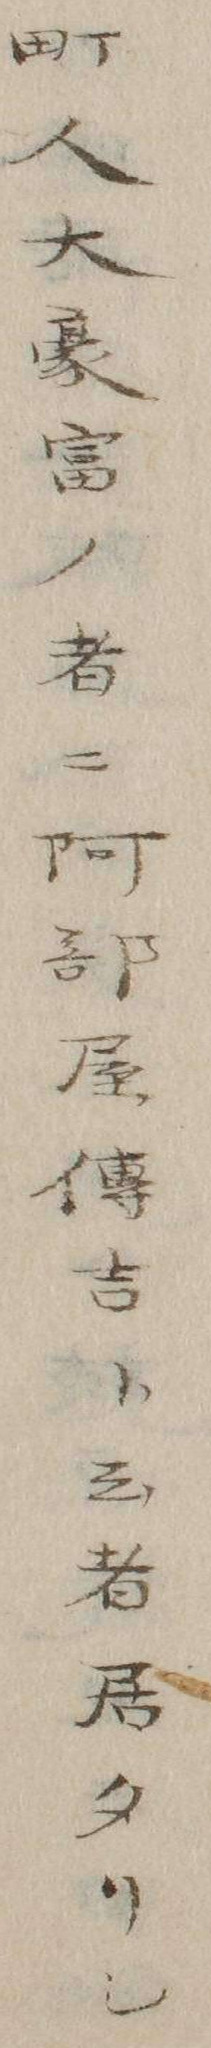町人大豪富ノ者ニ阿部屋伝吉ト云者居タリシ
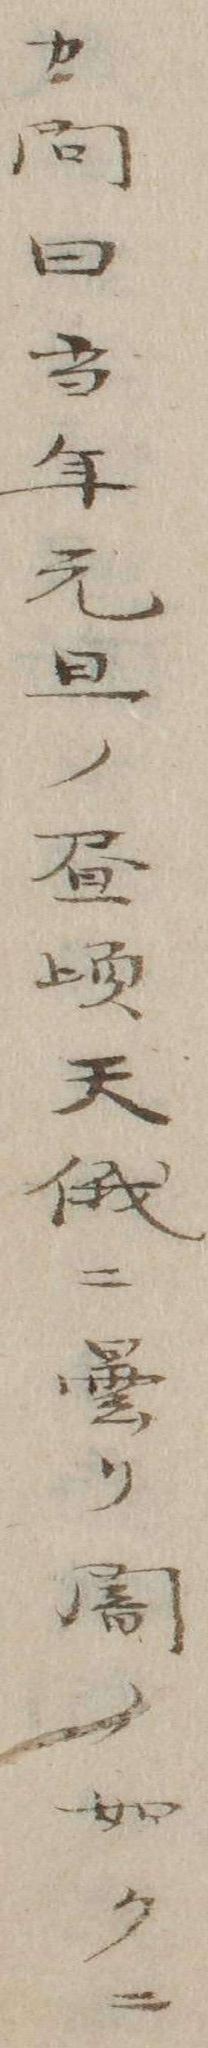カ問曰当年元旦ノ昼頃天俄ニ曇リ闇ノ如クニ

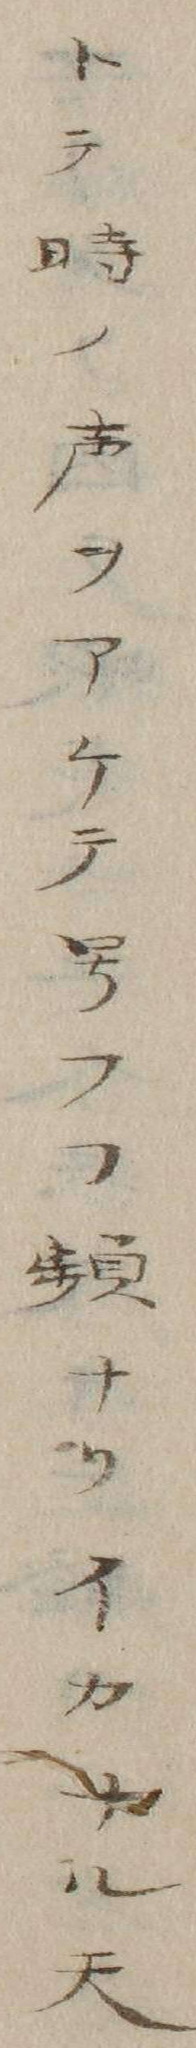トテ時ノ声ヲアケテ号フヿ頻ナリイカナル天
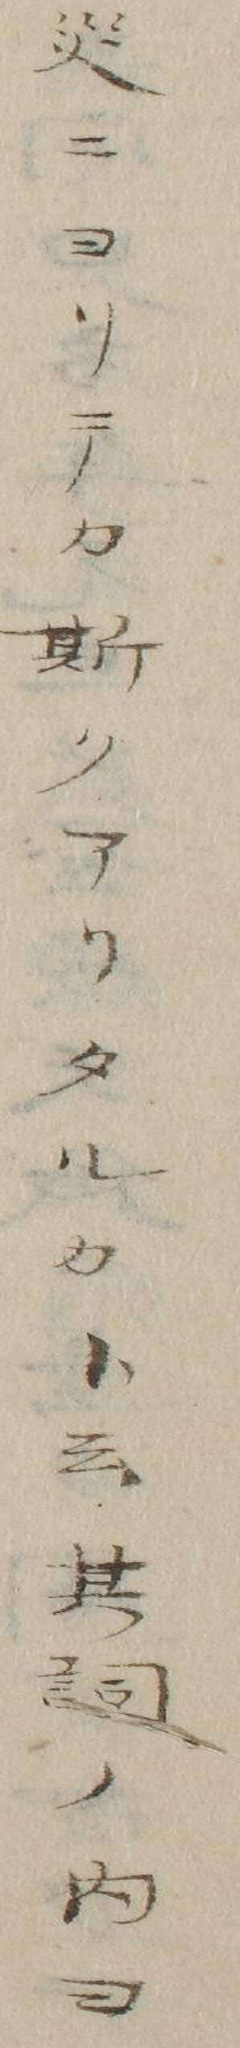災ニヨリテカ斯クアリタルカト云其詞ノ内ヨ
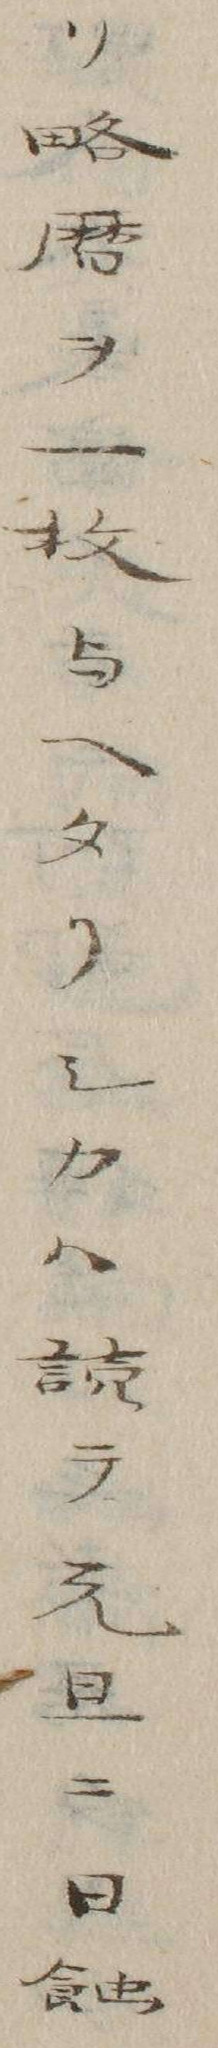リ略暦ヲ一枚与ヘタリシカハ読テ元旦ニ日蝕
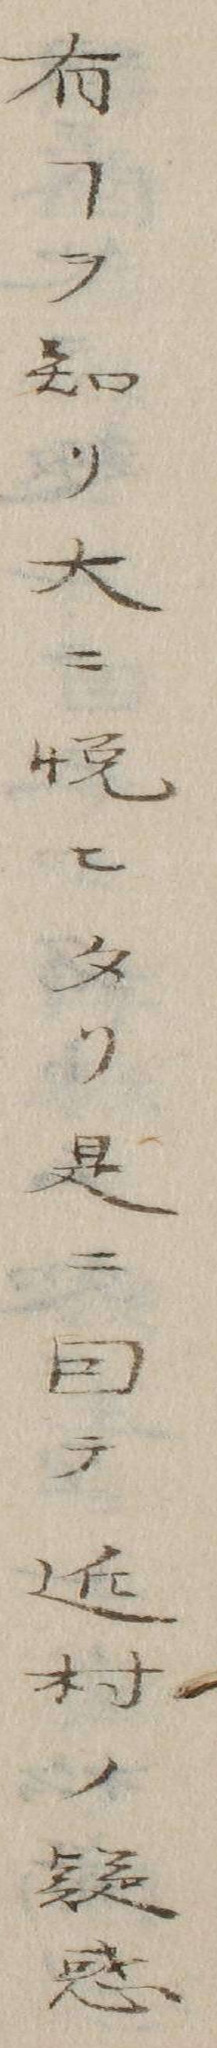有ヿヲ知リ大ニ悦ヒタリ是ニ因テ近村ノ疑惑
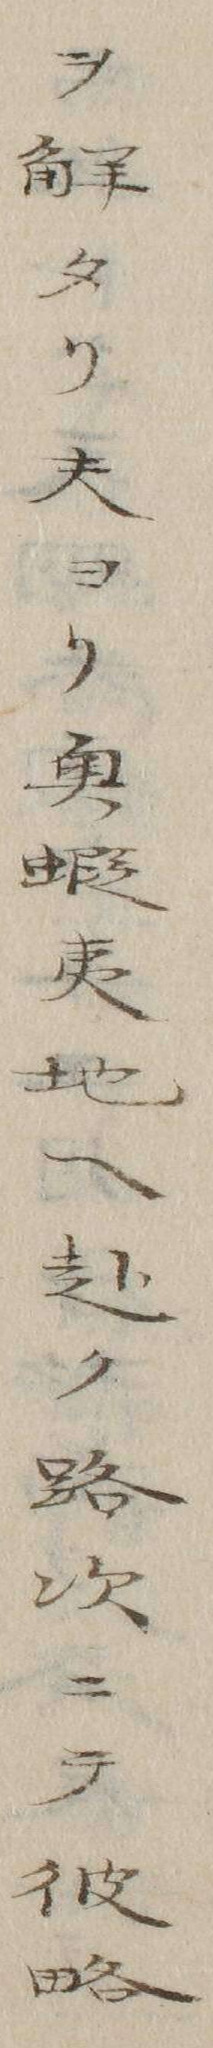ヲ鮮タリ夫ヨリ奥蝦夷地ヘ赴ク路次ニテ彼略
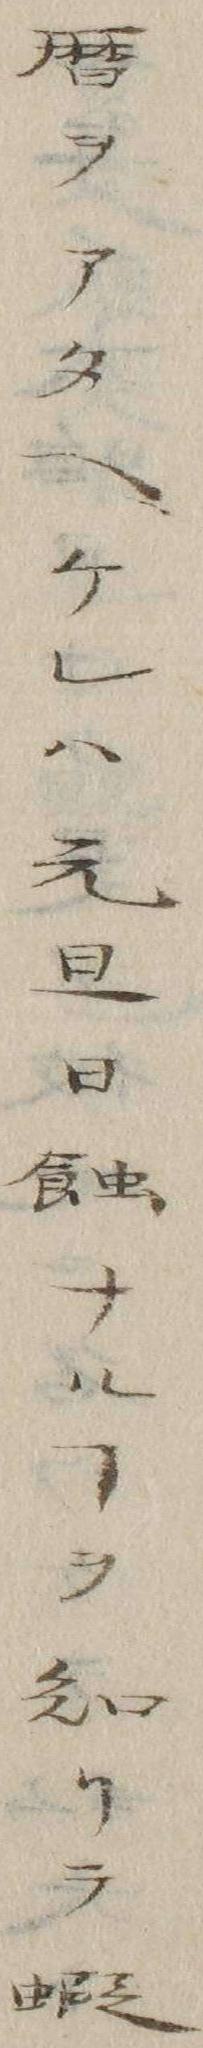暦ヲアタヘケレハ元旦日蝕ナルヿヲ知リテ蝦
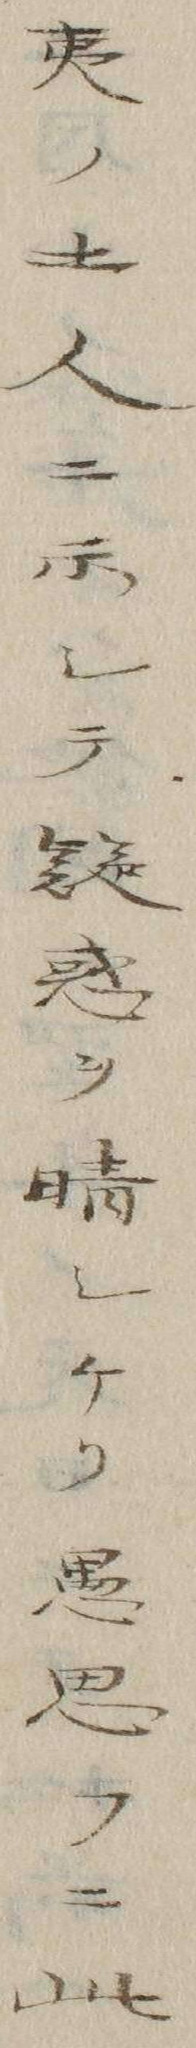夷ノ土人ニ示シテ疑惑ヲ晴シケリ愚思フニ此
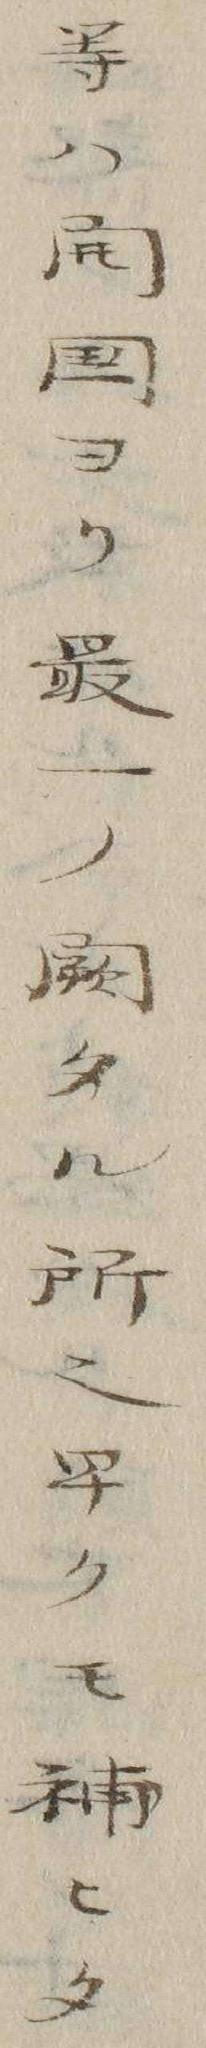等ハ開国ヨリ最一ノ闕タル所之卑クモ補ヒタ
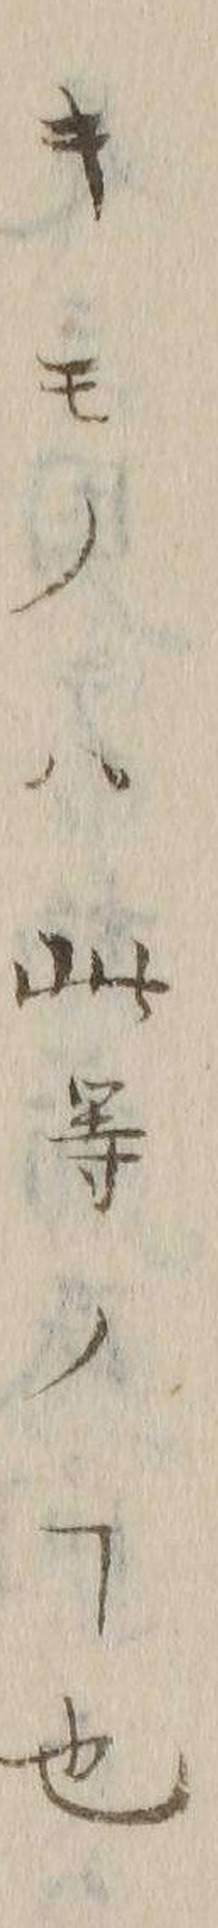キモノハ此等ノヿ也
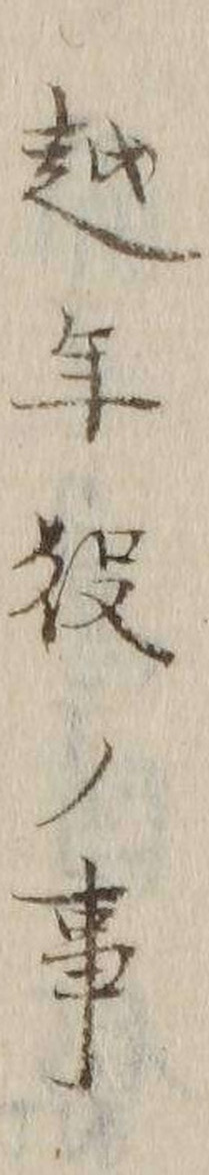越年役ノ事
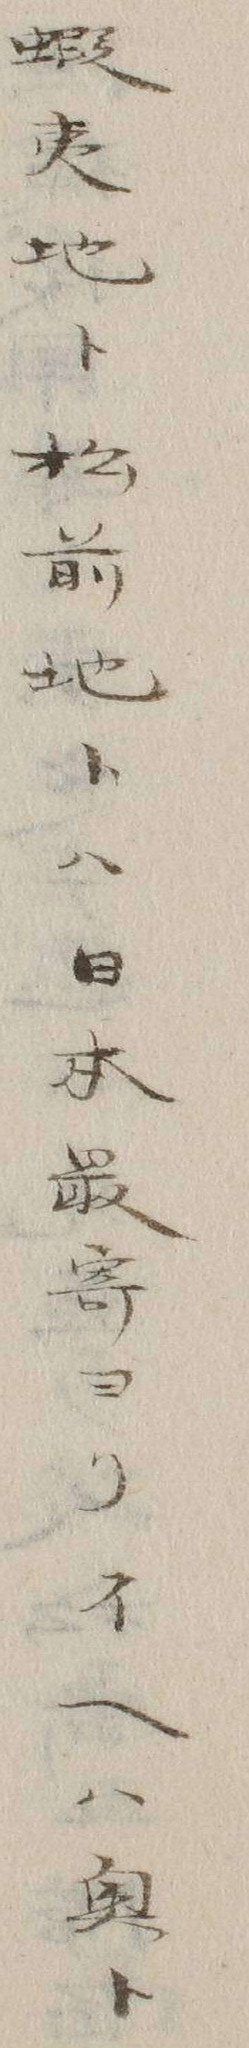蝦夷地ト松前地トハ日本最寄ヨリイヘハ奥ト
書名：蝦夷草紙（国文学研究資料館）
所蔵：国文学研究資料館
